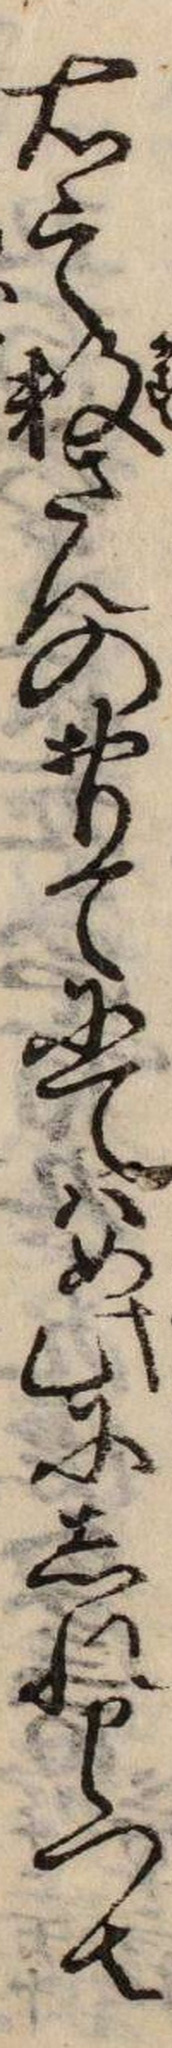右之数さんのおもてにては如此にしれ申つて
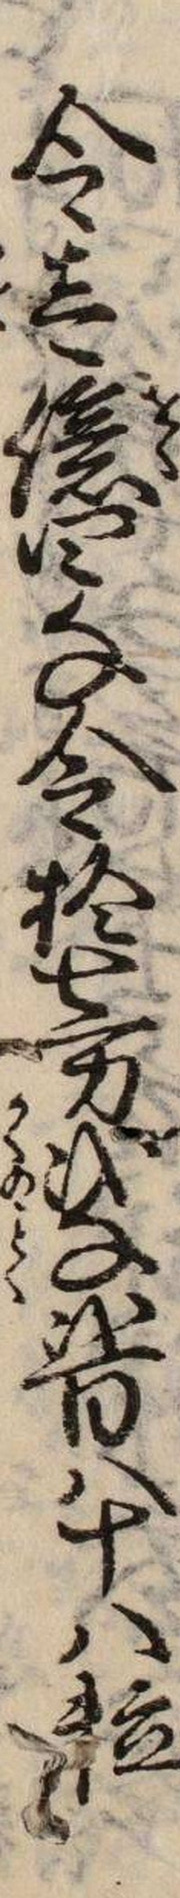令壱億四千令拾七万弐百八十八粒
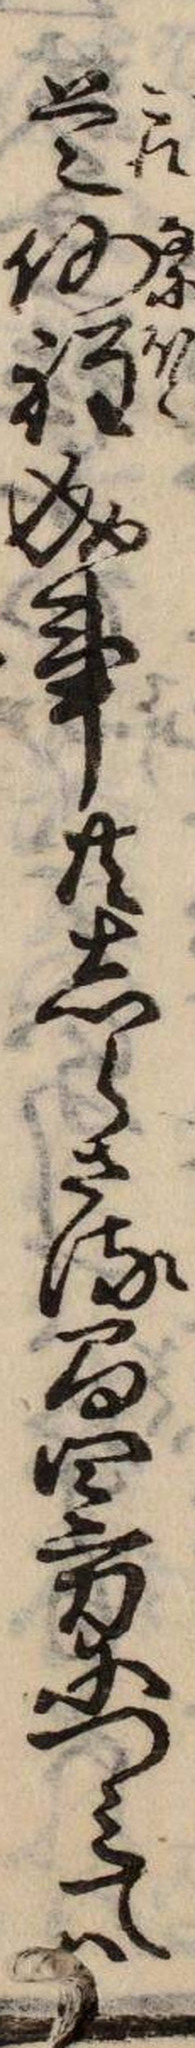是何程成事共しらさる間四方につみては
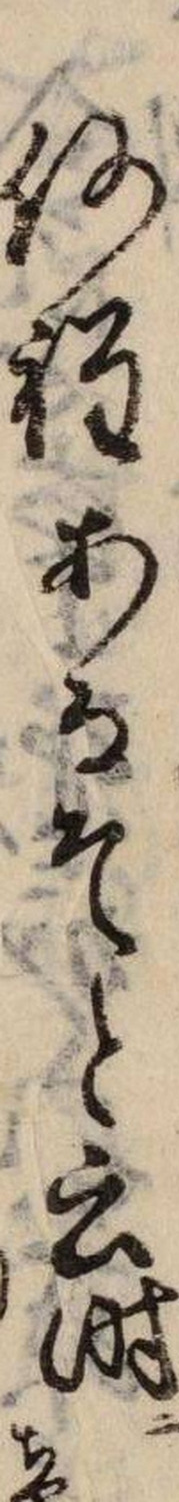何程あるそと云時に
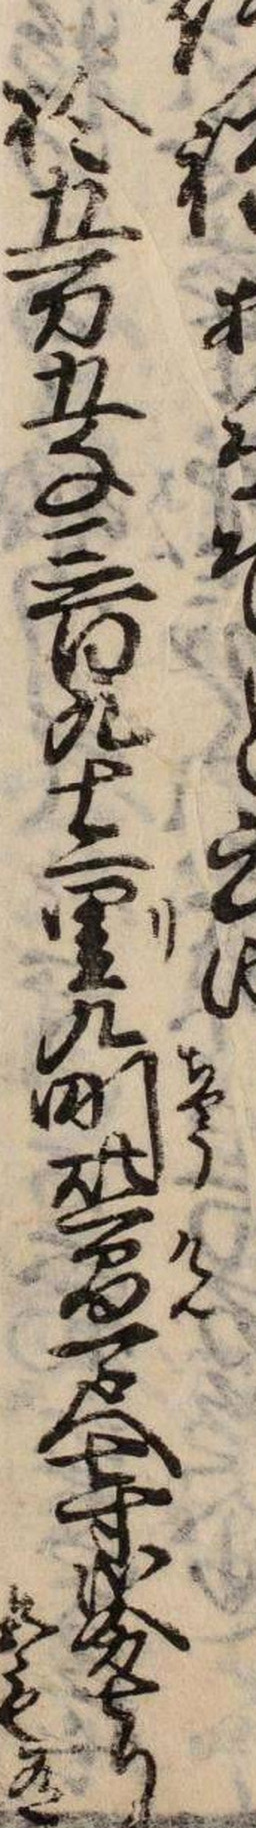拾五万五千三百九十二里九町卅一間一尺七寸弐分七り毛有
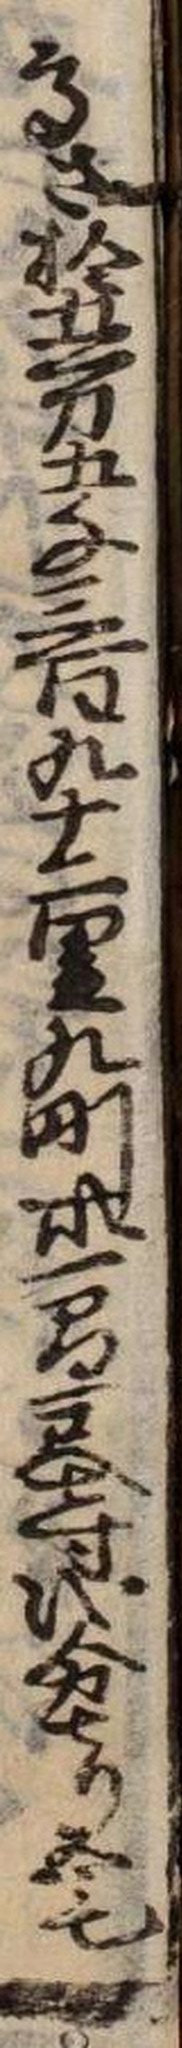高さ拾五万五千三百九十二里九町卅一間一尺七寸弐分七り五毛
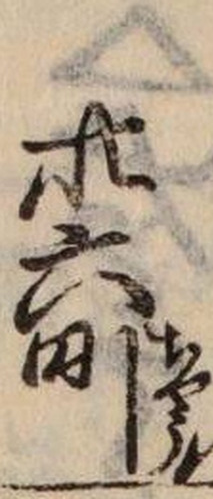卅六町
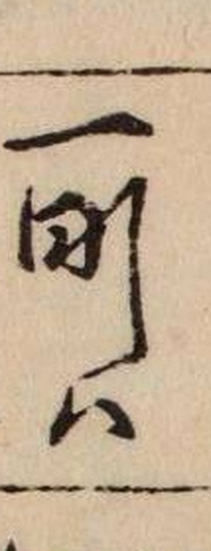一町は
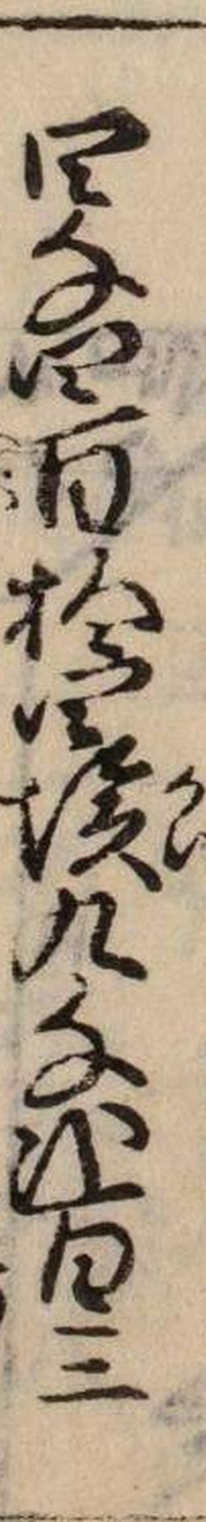四千四百拾四垓九千弐百三
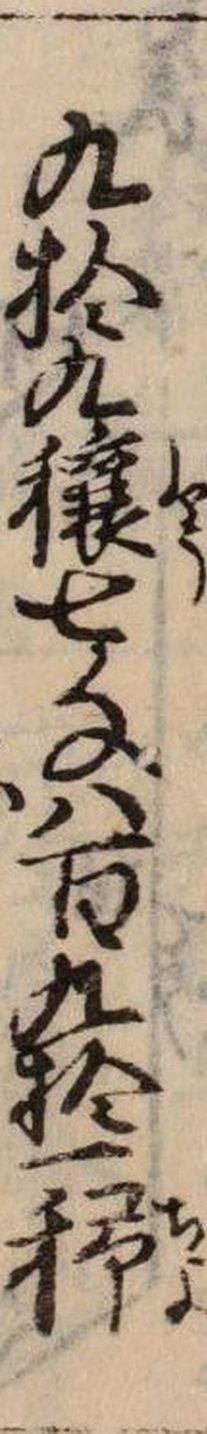九拾九穣七千八百九拾一杼
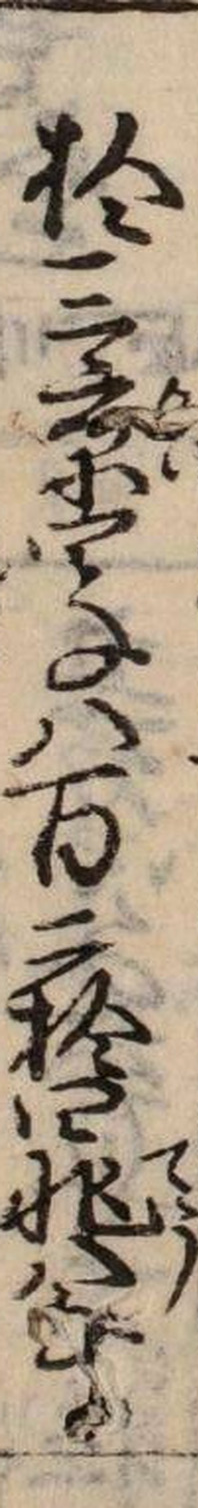拾三京四千八百二拾四兆八千
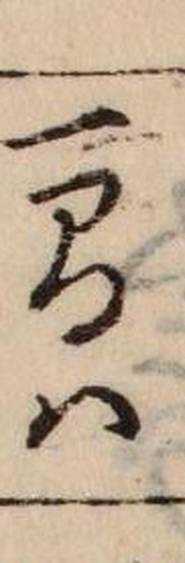一間は
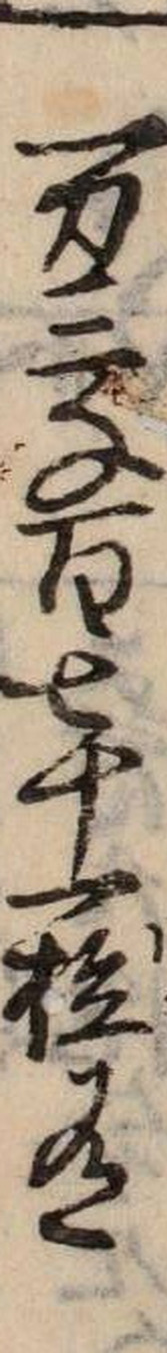万三千百七十一粒有
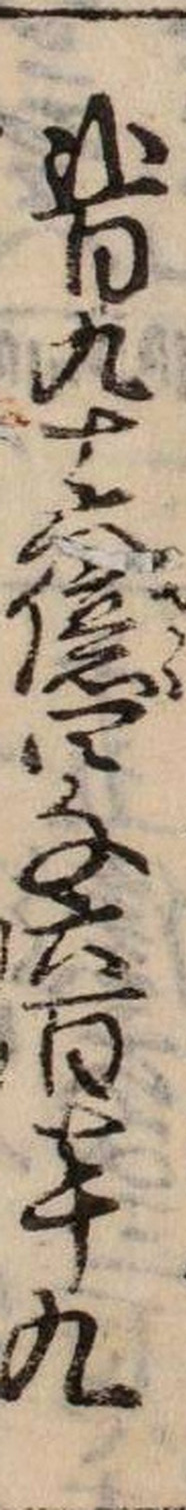弐百九十六億四千六百七十九
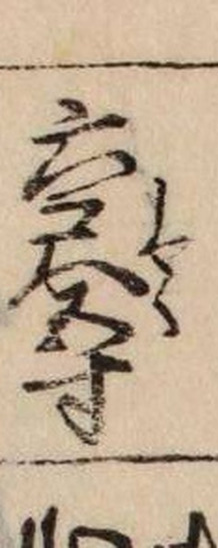六尺五寸
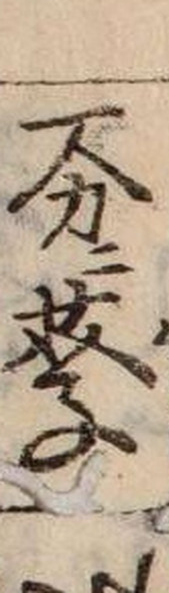一分に芥子
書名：塵劫記（寛永11年自跋、京都府立京都学・歴彩館追貴8）
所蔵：京都府立京都学・歴彩館 国文学研究資料館
